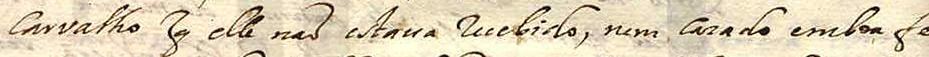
Carvalho q̄ elle naõ estaua Recebido, nem cazado em boa fe
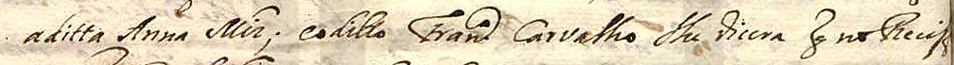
a ditta Anna Miz̄; e o ditto Fran.co Carvalho lhe dicera q̄ no Recif
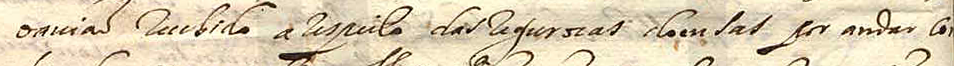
o auiaõ Recebido a Respeito das Regurozas doensas por andar con
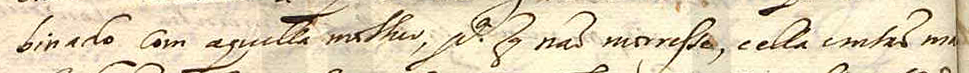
binado com aquella molher, pa. q̄ naõ morresse, e ella emtaõ ma
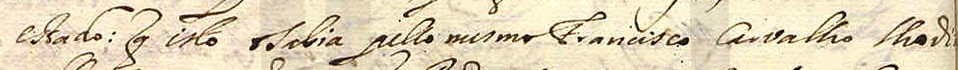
estado: q̄ isto o sabia pello mesmo Francisco Carvalho lho di
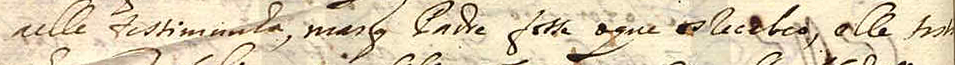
a elle testimunha, mas q̄ Padre fosse o que os Recebeo, elle tes
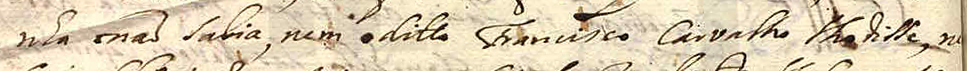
nha o naõ sabia, nem o ditto Francisco Carvalho lhe disse, n
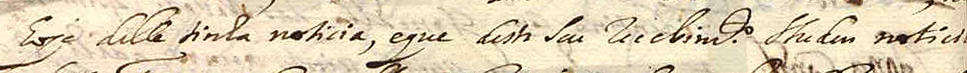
hoje delle tinha noticia, e que deste seu Recebim.to lhe deu notici
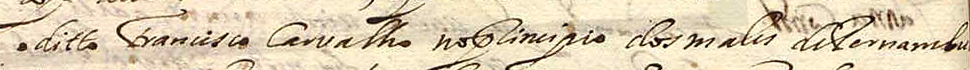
o ditto Francisco Carvalho no principio dos males de Pernambu
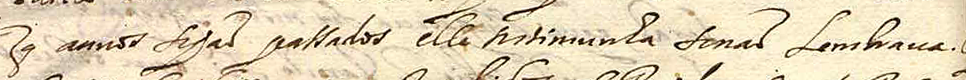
q̄ annos sejaõ passados elle testimunha senaõ Lembraua.
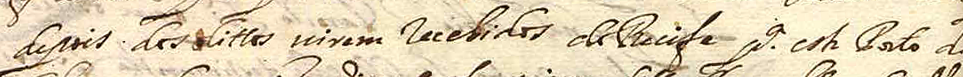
depois dos dittos uirem Recebidos de Recife p.a este Porto do
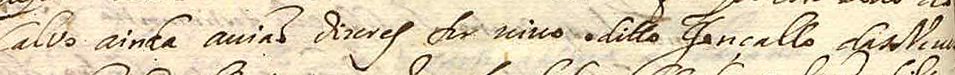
Calvo ainda auiaõ diceres ser uiuo o ditto Gonçallo das Neue
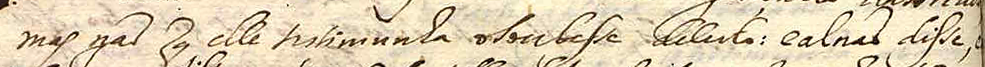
mas naõ q̄ elle testimunha o soubesse de certo: e al naõ disse,
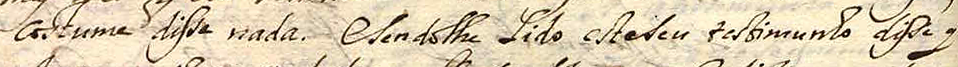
costume disse nada. E sendolhe Lido este seu testimunho disse qu
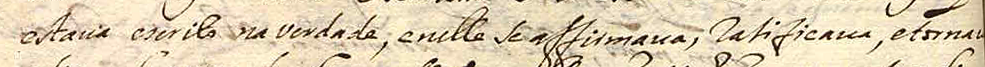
estaua escrito na verdade, e nelle se affirmaua, Ratificaua, e tornau
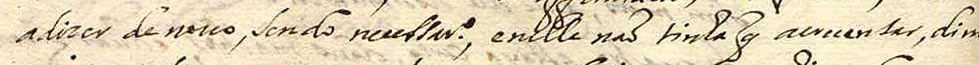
a dizer de nouo, sendo necessar.o, e nelle naõ tinha q̄ acrecentar, dim
